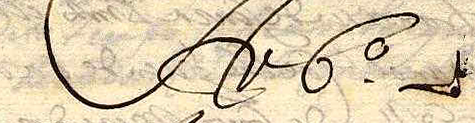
Ao 6.o
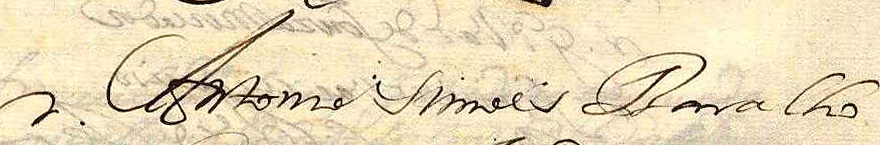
item. Antonio Simoes Baralho
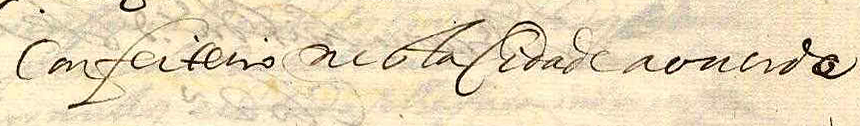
confeiteiro nesta Cidade ao uerde
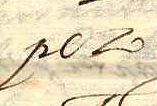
pezo
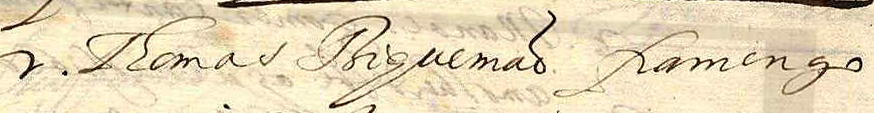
item. Thomas Biquemaõ framengo
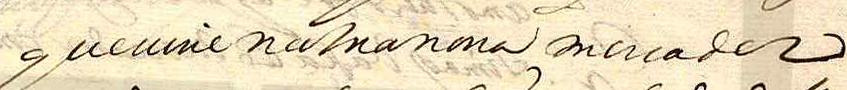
que uiue na rua noua mercador
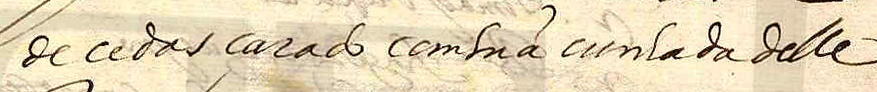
de cedas cazado com huā cunhado delle
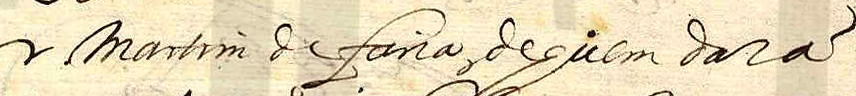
item. martim de faria, de quem daraõ
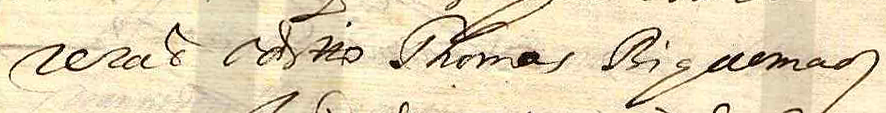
rezaõ o ditto Thomas Biquemaõ
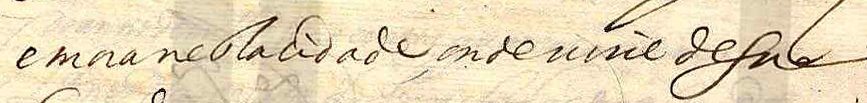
e mora nesta cidade, onde uiue de sua
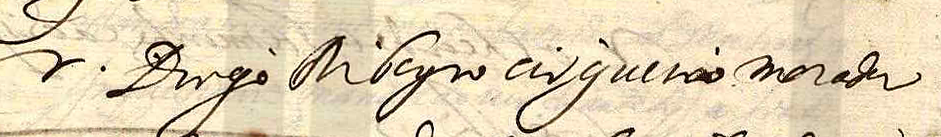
item. Diogo Ribeyro cirgueiro morador
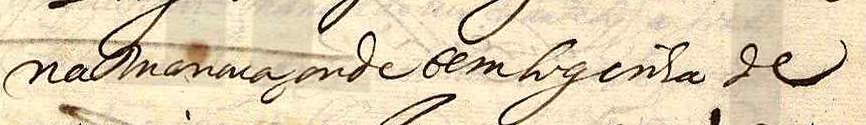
na Rua noua, onde tem loginha de
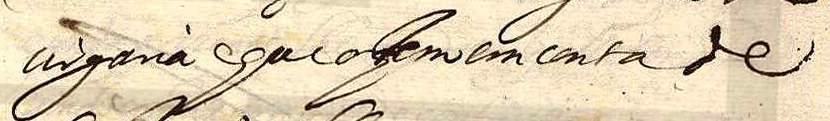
cirgaria e que o tem em conta de
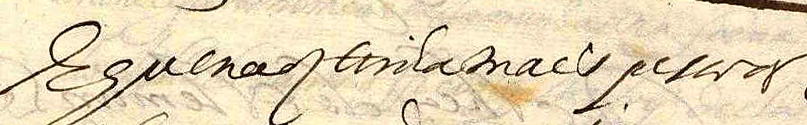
E que naõ tinha maes pessoas
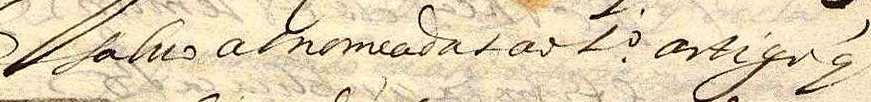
saluo as nomeadas ao 1.o artigo q̄
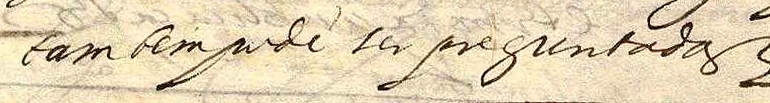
tambem podē ser preguntadas
